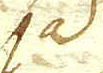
1.a
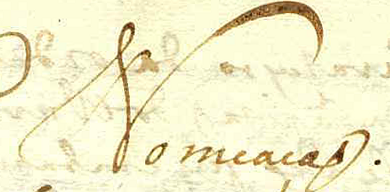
Nomeaçaõ
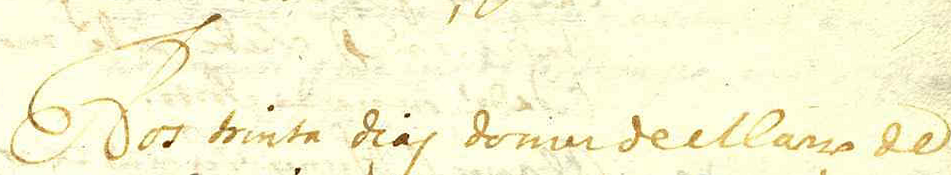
Aos trinta dias do mes de Março de
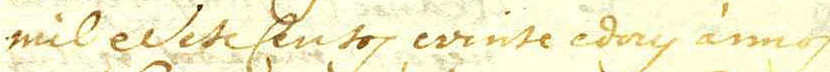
mil e SeteCentos, e vinte dous annos
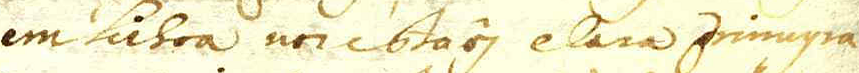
em Lisboa nos estaōs e Caza primeyra
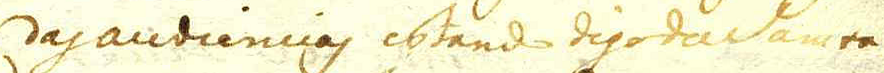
das audiencias estando digo da Sancta
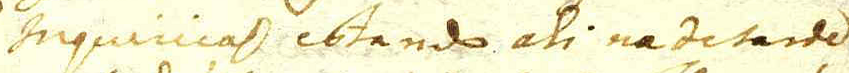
Inquiziçaõ estando ali na de tarde
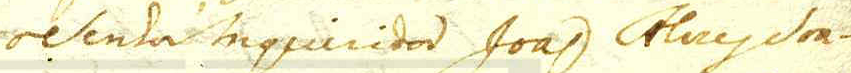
o Senhor Inquizidor Joaõ Alvres Soa
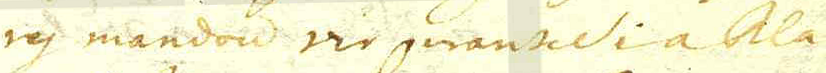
res mandou vir perante Si a Ma
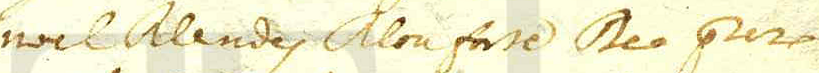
noel Mendes Monforte Reo prezo
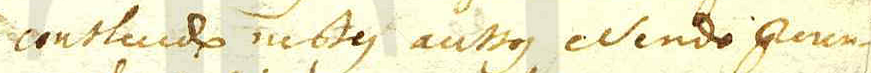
contheudo nestes auttos, e Sendo prezen
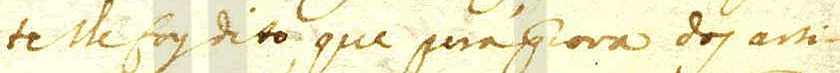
te lhe foy dito que pera prova dos arti
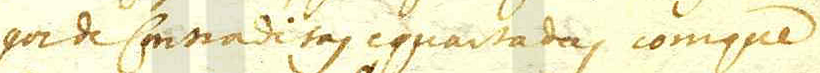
gos de Contraditas e quartadas com que
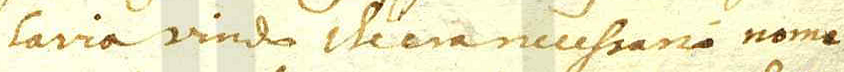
havia vindo lhe era necessario nome
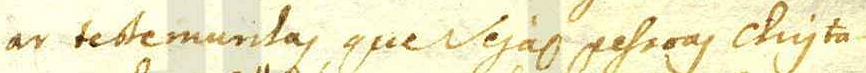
ar testemunhas, que sejaõ pessoas christa
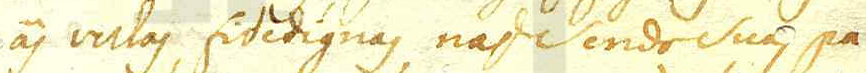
ās velhas, fidedignas, naõ Sendo Suas pa
